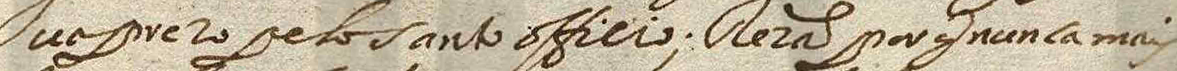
ua prezo pelo santo officio; Rezã por q̄ nunca mais
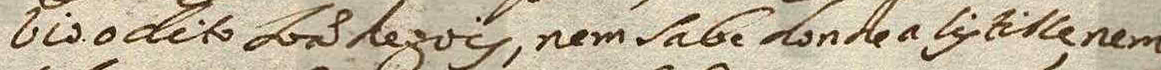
vio o dito Joã de gois, nem sabe donde asistisse, nem
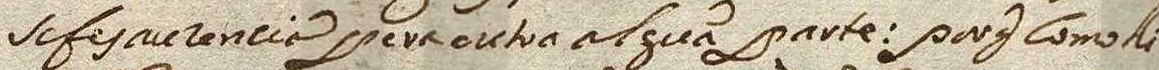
se fez auzencia pera outra alguā parte: porq̄ como di
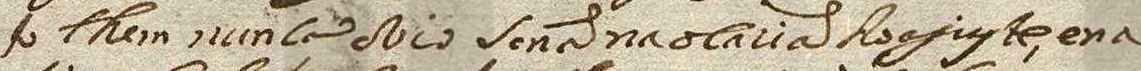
to them nunca o vio senã na oCaziã do ajuste, e na
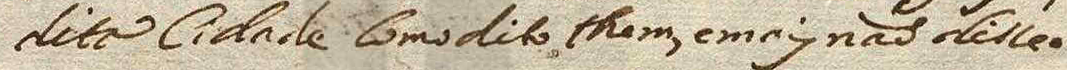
dita Cidade Como dito them, e mais naõ disse.
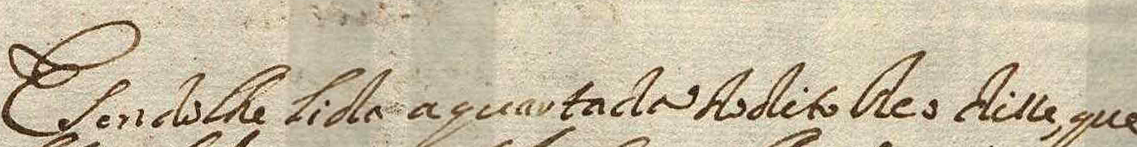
E sendolhe lida a quartada do dito Reo disse, que
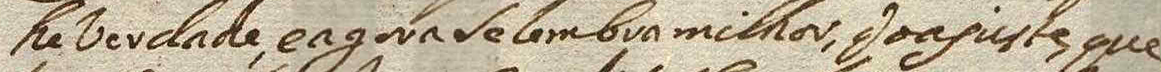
he verdade, e agora se lembra milhor, q̄ o ajuste que
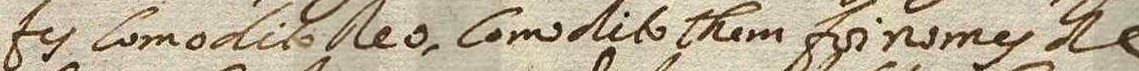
fes Como dito Reo, Como dito them foi no mes de
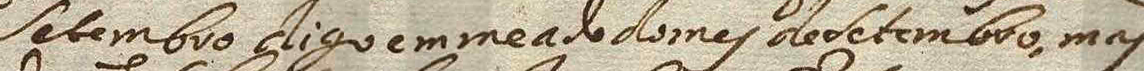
Setembro digo em meado do mes de setembro, mas
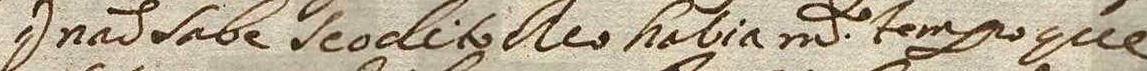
q̄ naõ sabe se o dito Reo havia m.to tempo que
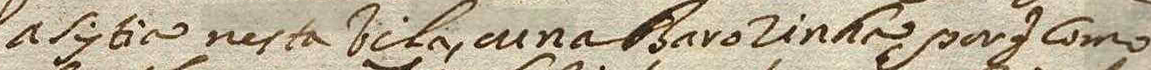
asistia nesta vila, ou na Barozinha, porq̄ Como
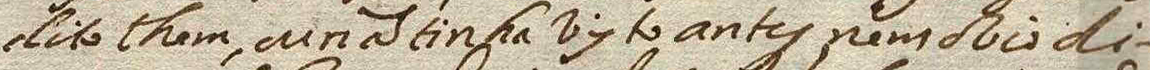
dito them, ou nã tinha visto antes, nem o vio di
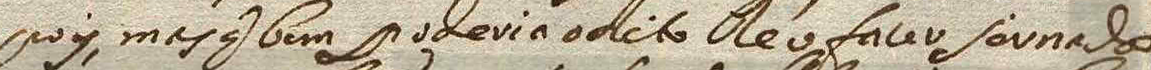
pois, mas q̄ bem poderia o dito Reo facer jornada
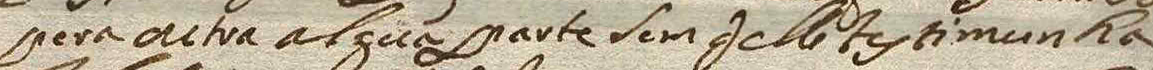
pera outra alguā parte sem q̄ elle testimunha
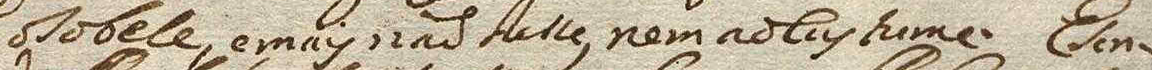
o sobeCe, e mais naõ disse, nem ao custume. E sen
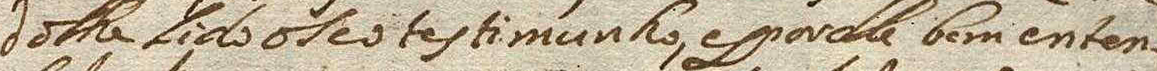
dolhe lido o seo testimunho, e por elle bem enten
